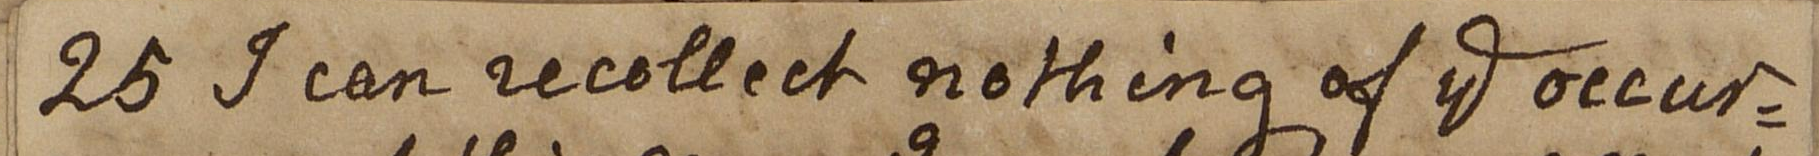25 I can recollect nothing of y^e occur-
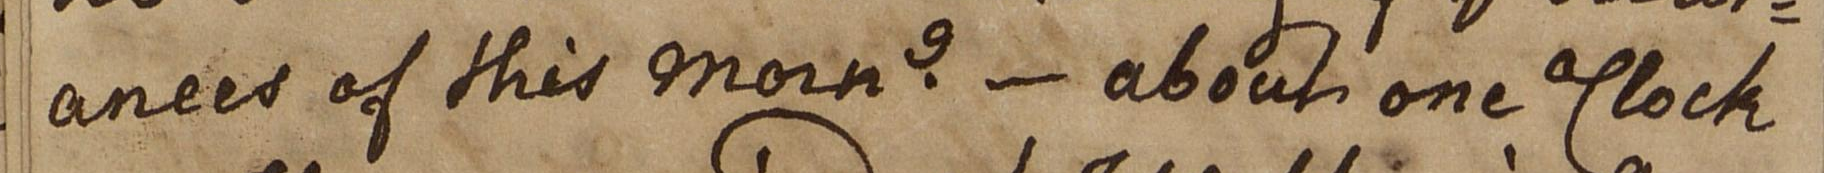ances of this morn^g.- about one ^o Clock
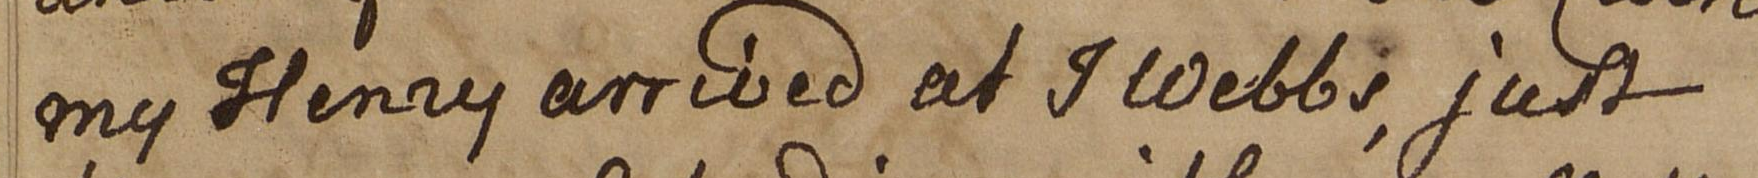my Henry arrived at T Webbs, just
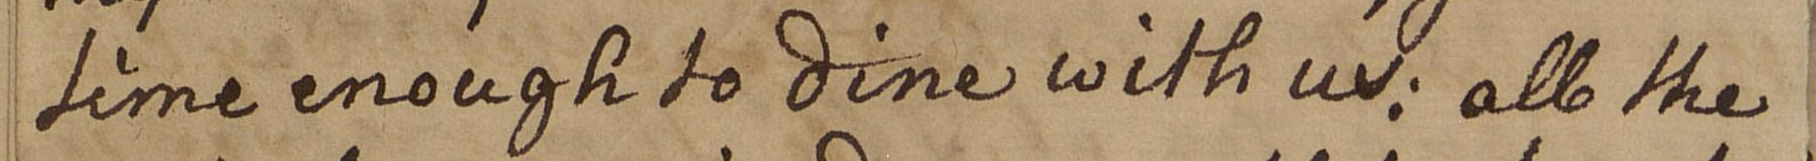time enough to dine with with us: all the
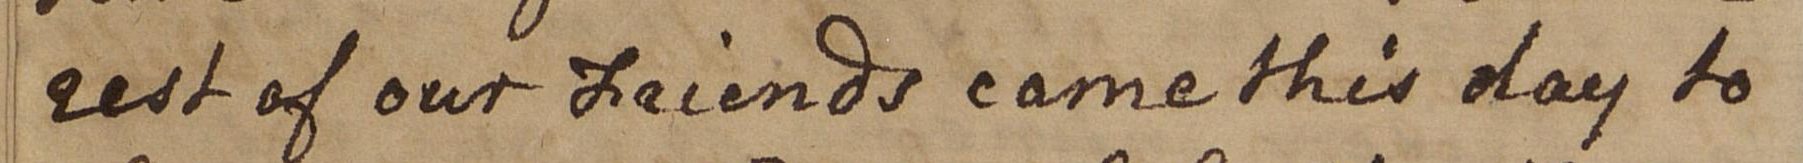rest of our Friends came this day to
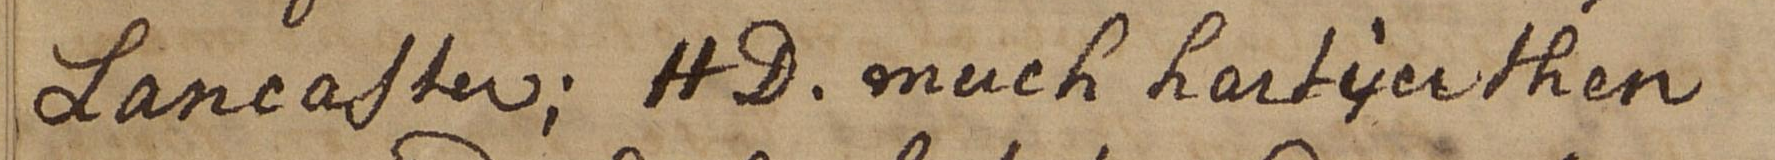Lancaster; HD. much hartier then
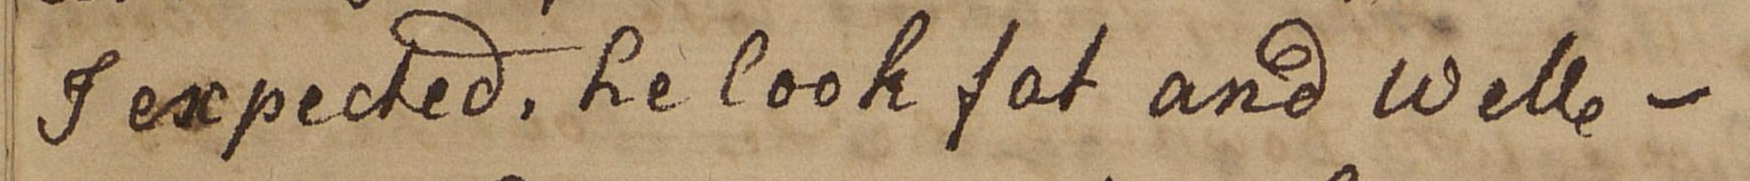I expected, he look fat and well-
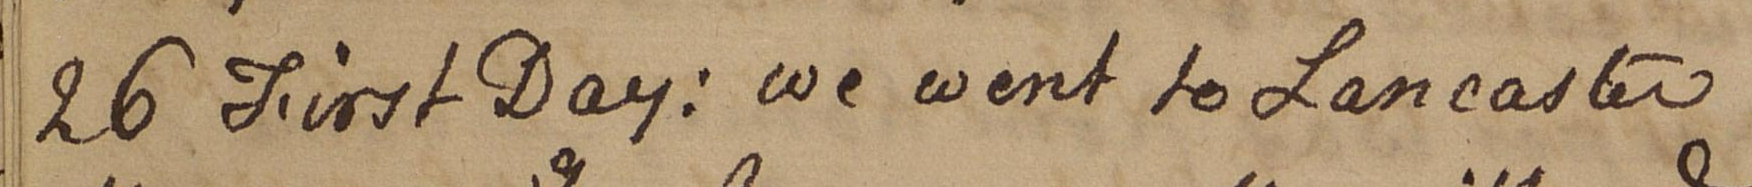26 First Day: we went to Lancaster
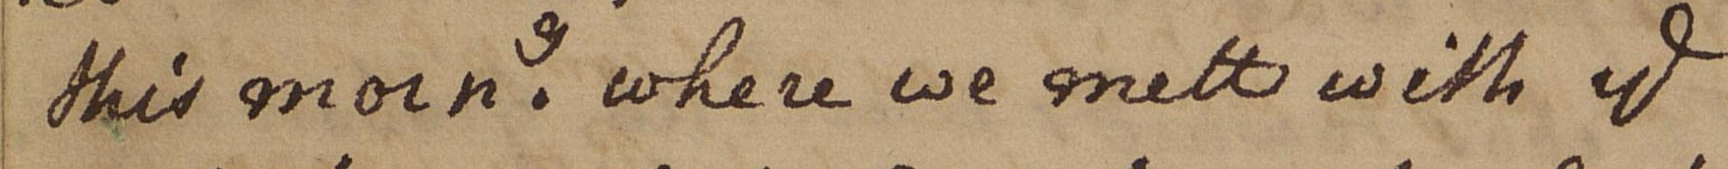this morn^g. where we mett with y^e
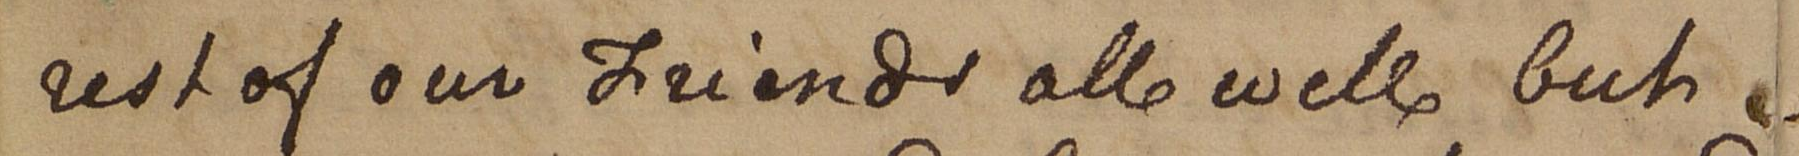rest of our Friends all well but
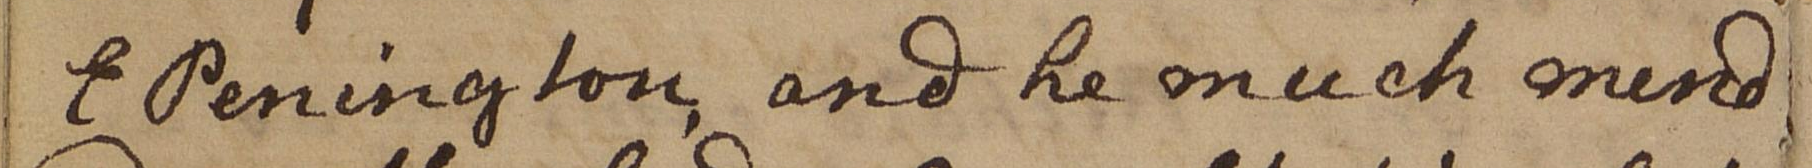E Penington, and he much mend
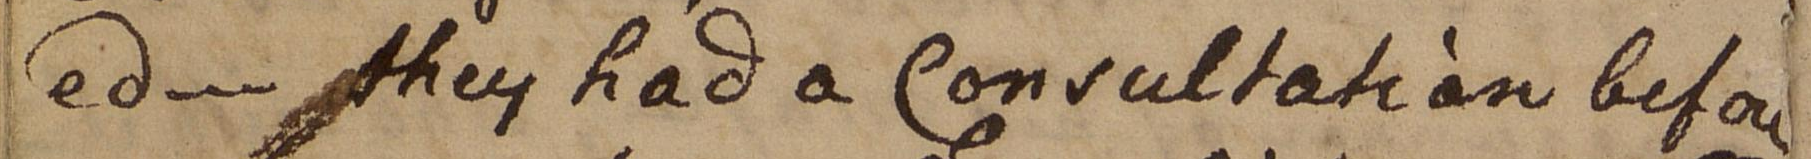ed- they had a Consultation before
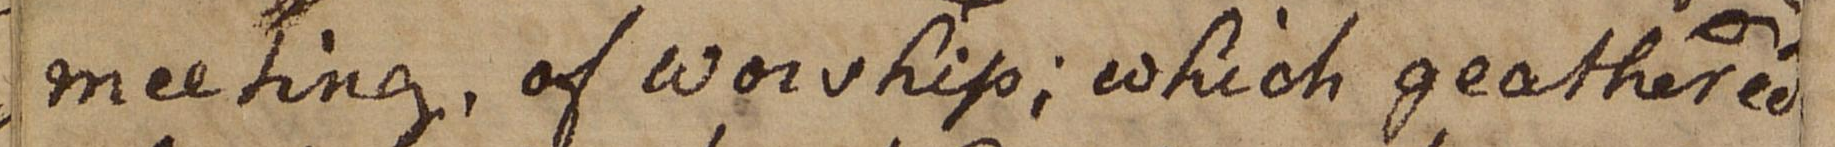meeting, of worship; which geathered
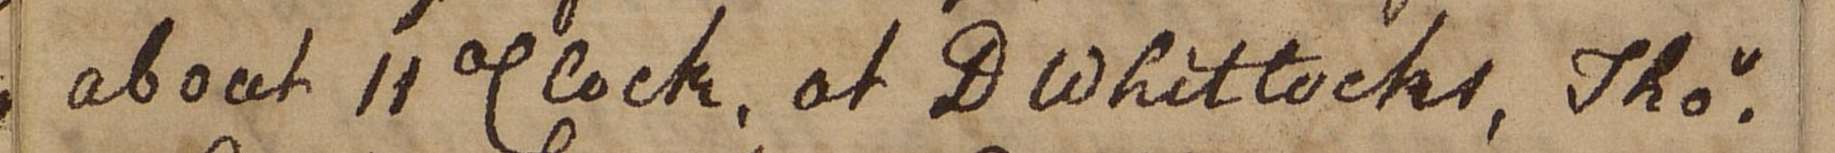about 11 ^o Clock, at D Whittocks, Tho^s.
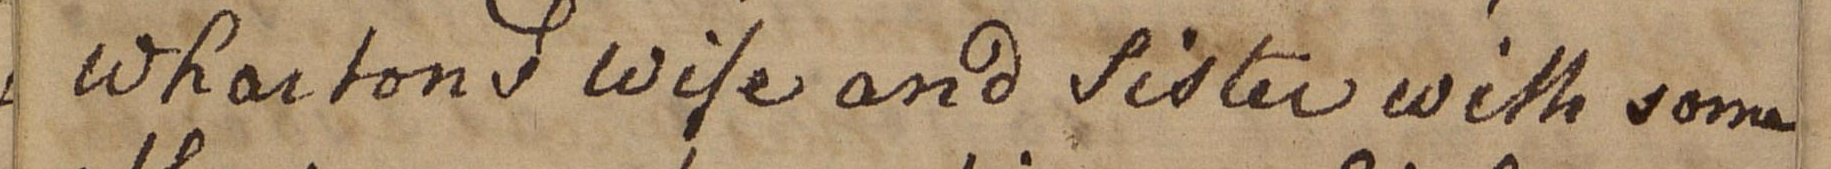Whartons wife and Sister with some
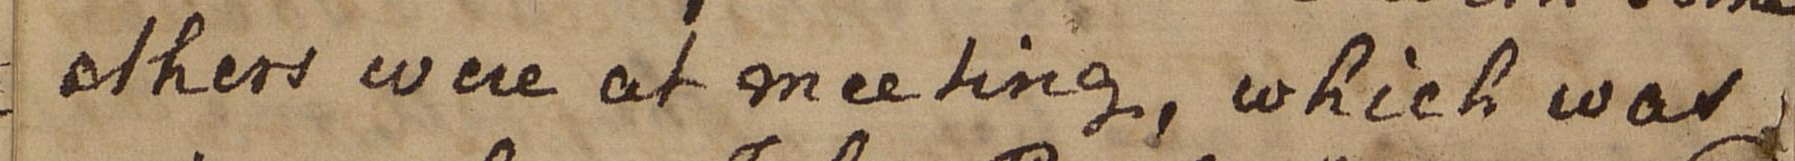others were at meeting, which was
